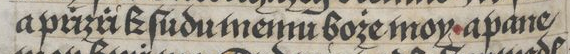a pṙizṙi k ſudu memu boże moy.a pane
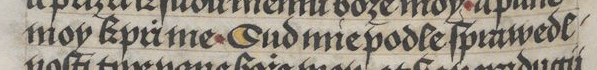moy kpṙime.Sud mie podle ſprawedl¬
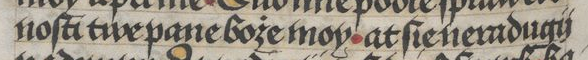noſti twe pane boże moy.at ſie neradugij
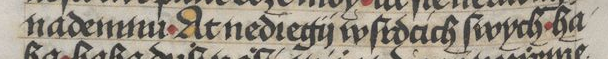nademnu.At nediegij w ſrdcích ſwych.ha¬
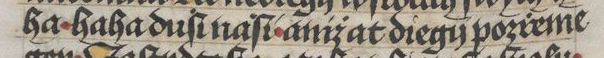ha.haha duẛi naẛí.aníż at diegij pozṙeme
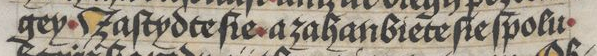gey.Zaſtydte ſie.a zahanbiete ſie ſpolu.
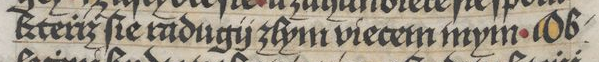kteṙíż ſie radugij zlym viecem mym.Ob¬
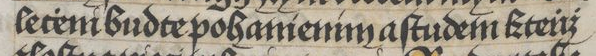leċeni budte pohaníením a ſtudem kteṙiż
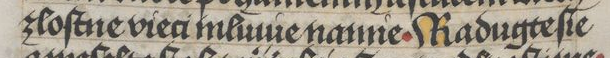zloſtne vieci mluuie namie.Radugteſie
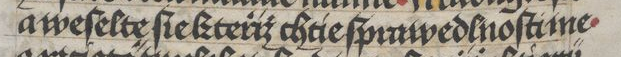a weſelte ſie kteṙíż chtie ſprawedlnoſti me.
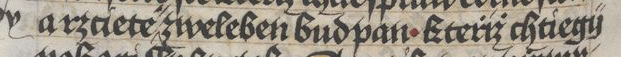a rzciete zweleben bud pan.kteṙíż chtiegij
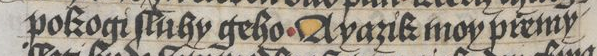pokogi ſluhy geho.A yazik moy pṙemy¬
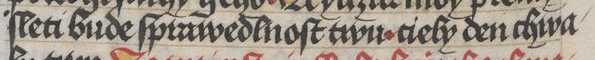ẛleti bude ſprawedlnoſt twu.ciely den chwa¬
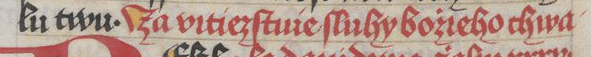lu twu.Za vitíezſtuíe ſluhy bożieho chwa¬
